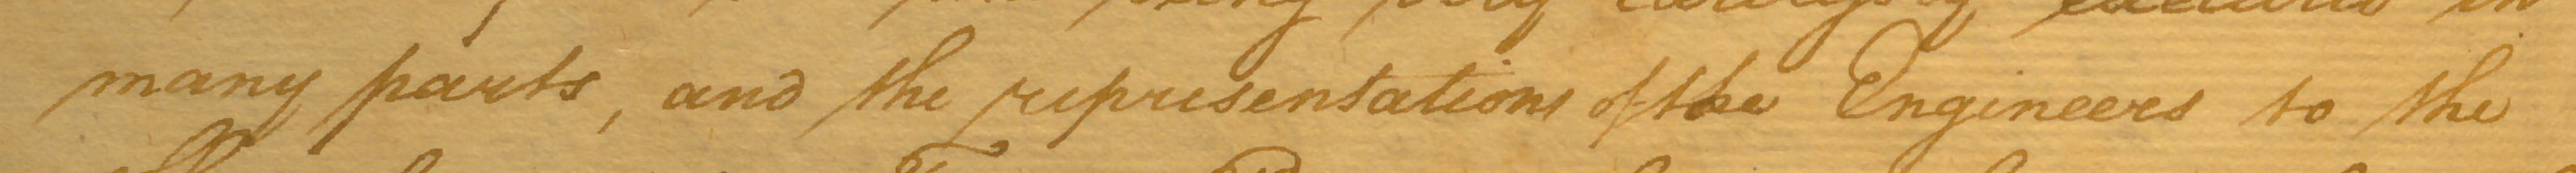many parts, and, the representations of the Engineers to the
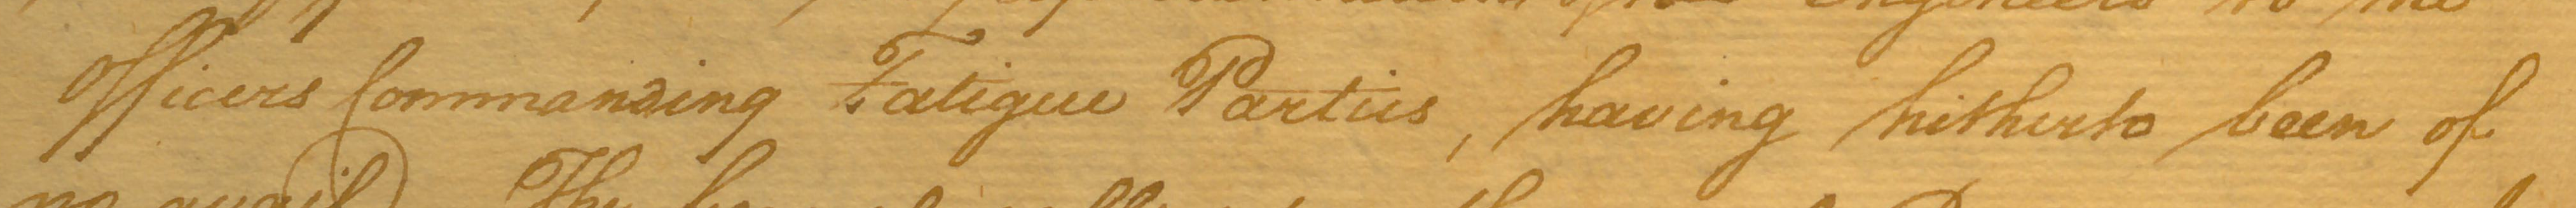officers Commanding Fatigue Parties, having hitherto been of
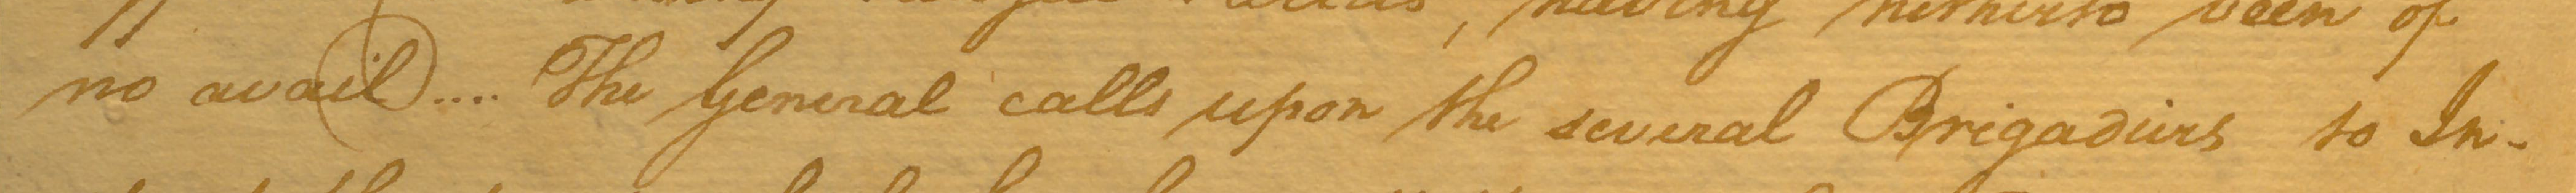no avail.... The General calls upon the several Brigadiers to In-
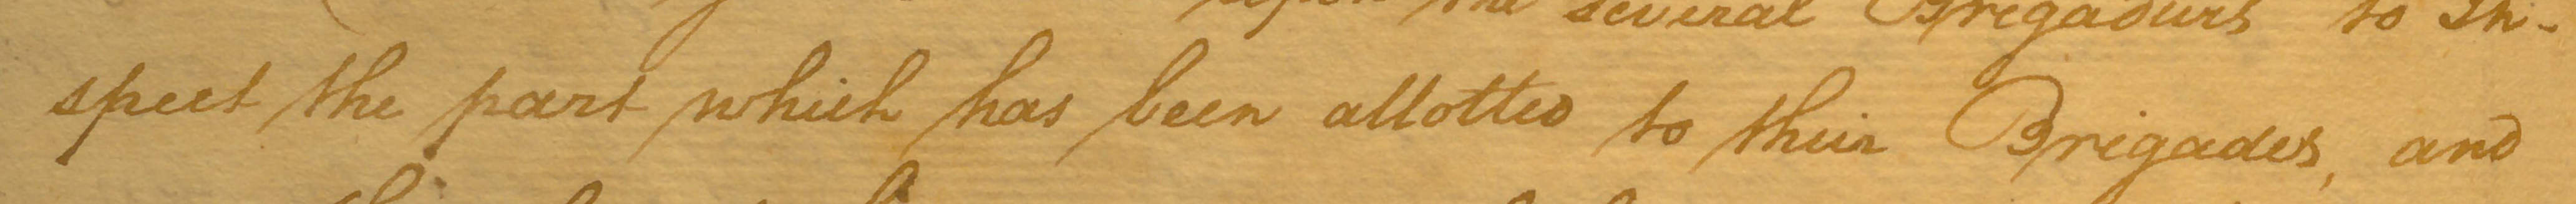spect the part which has been allotted to this Brigades, and
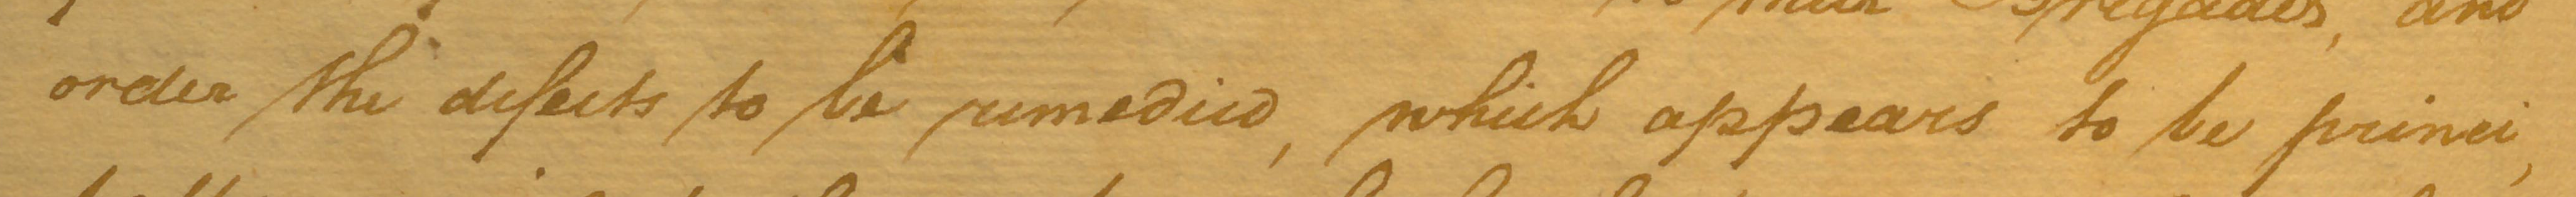order the defects to be remedied, which appears to be princi
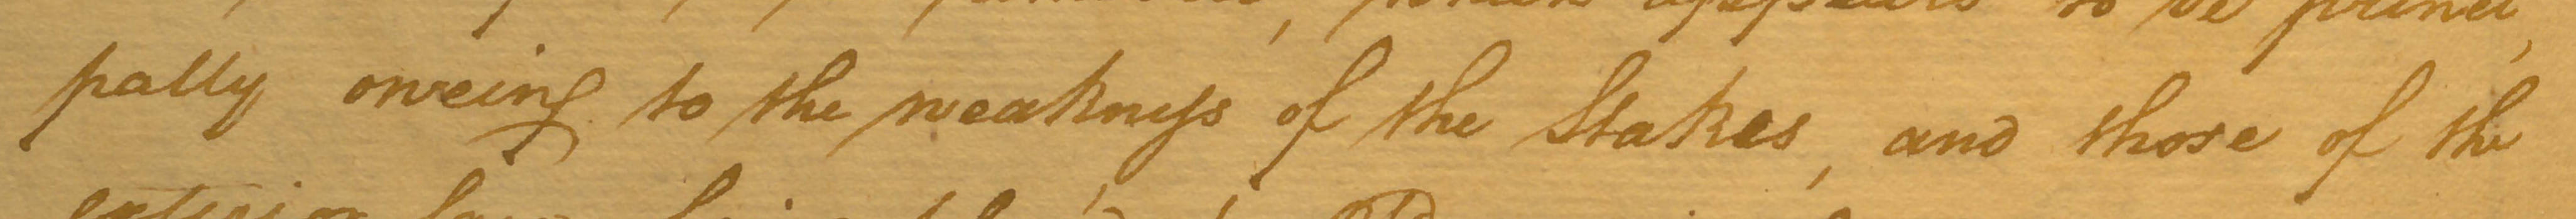pally oweing to the weakness of the Stakes, and those of the
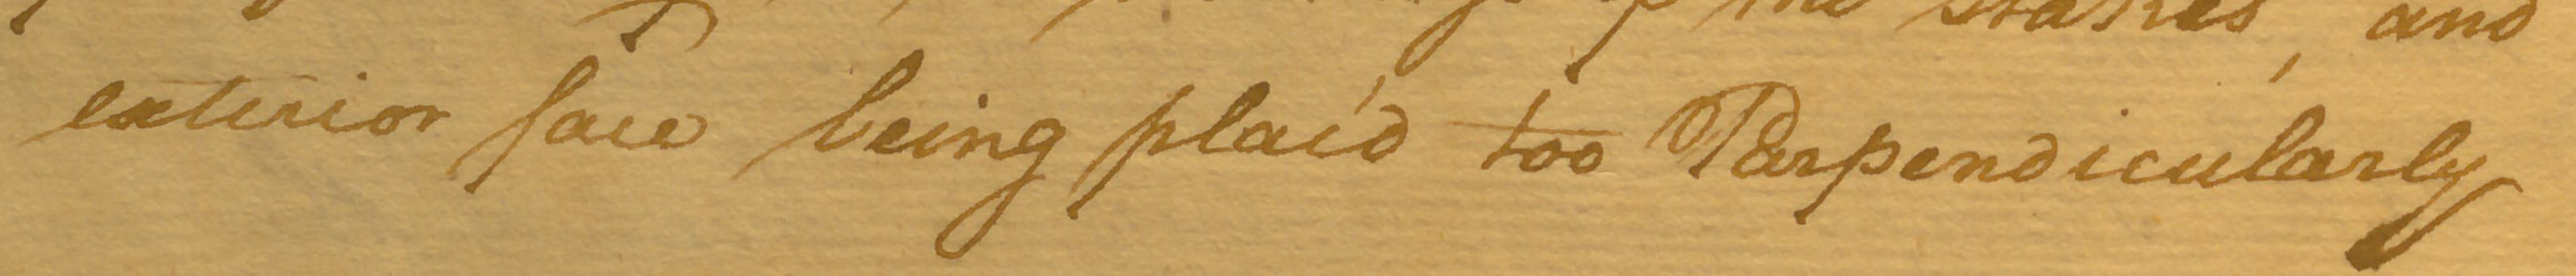exterior face being plac'd too Parpendicularly
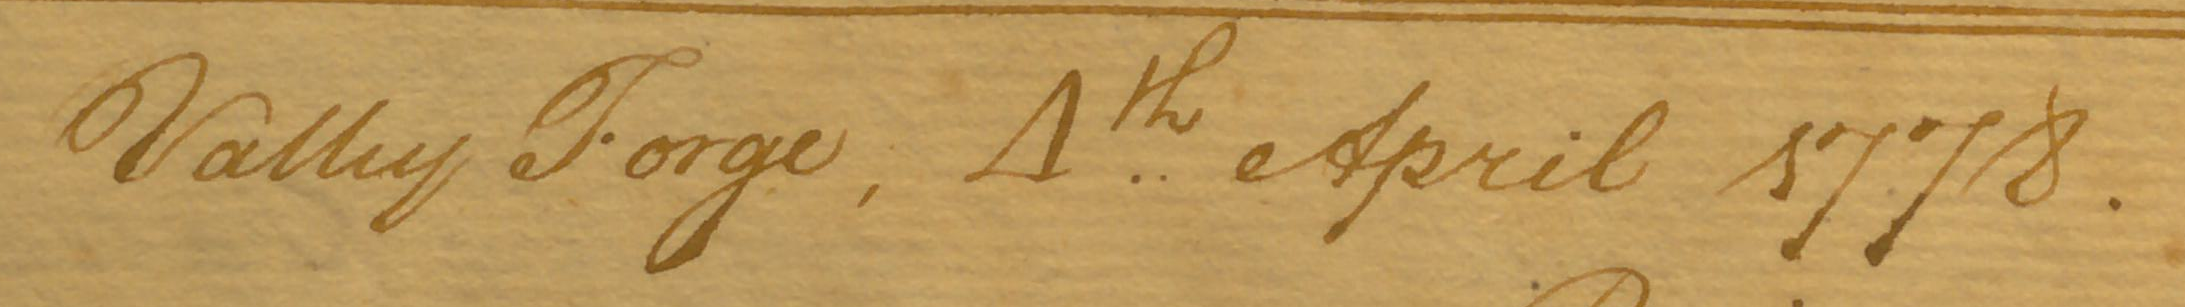Valley Forge, 4^th. April 1778.
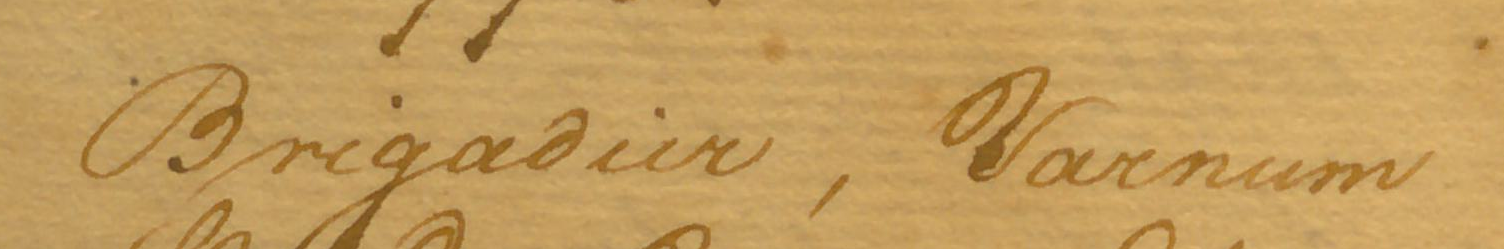Brigadier, Varnum
